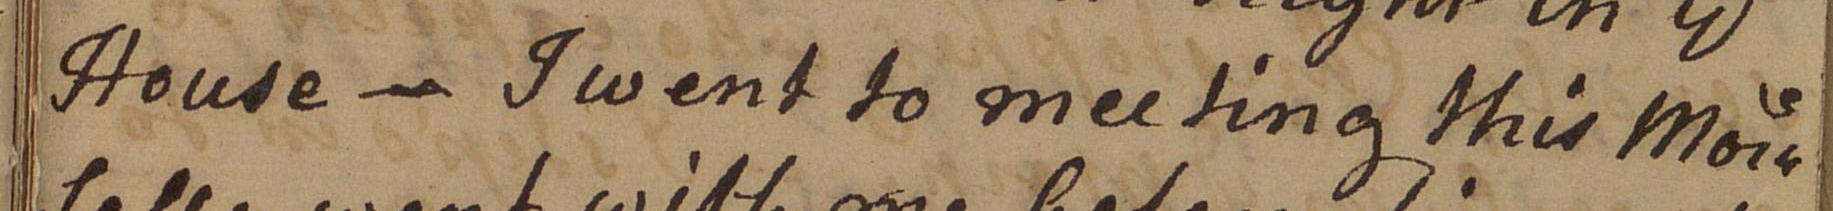House- I went to meeting this Morn^g
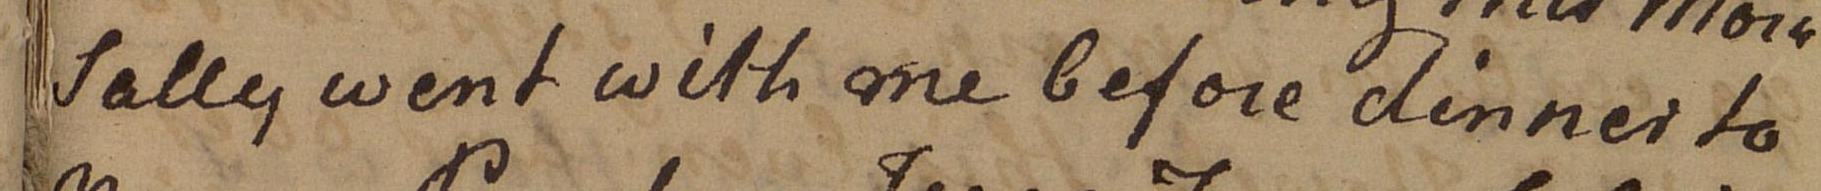Sally went with me before dinner to
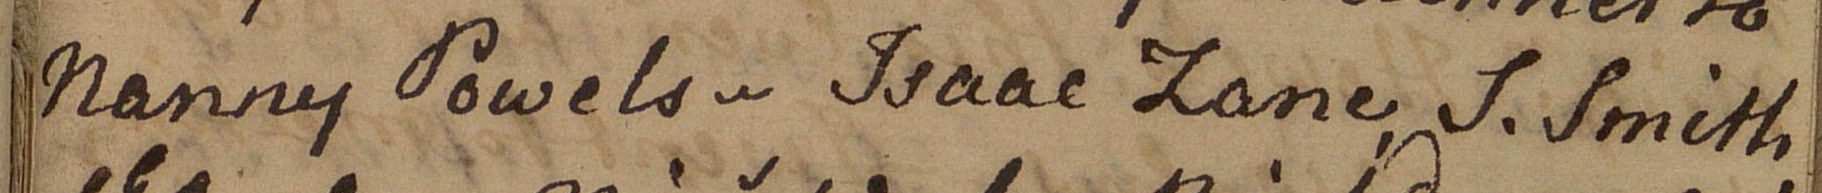Nanny Powels- Isaac Zane, S. Smith,
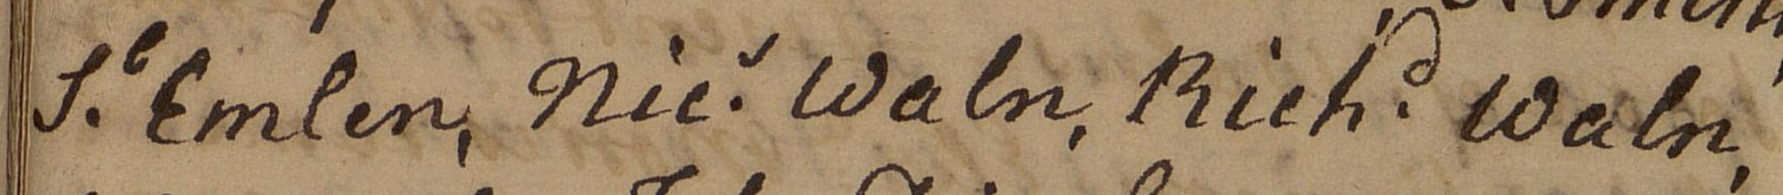S^l. Emlen, Nic^s. Waln, Rich^d. Waln,
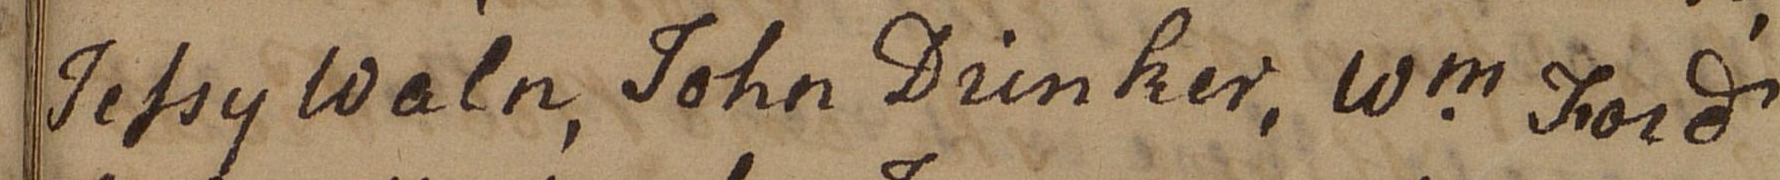Jessy Waln, John Drinker, W^m. Ford
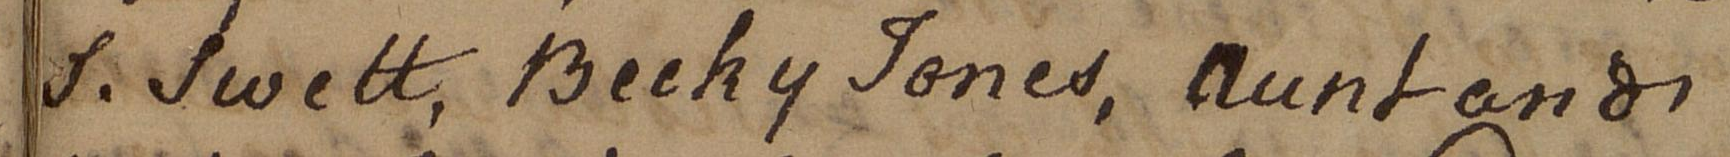S. Swett, Becky Jones, Aunt and
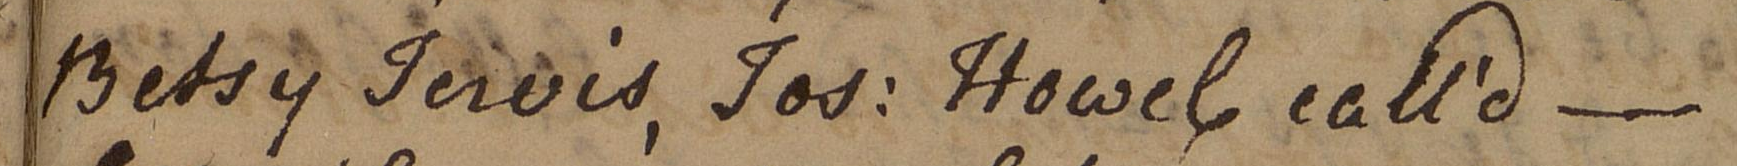Betsy Jervis, Jos: Howel call'd-
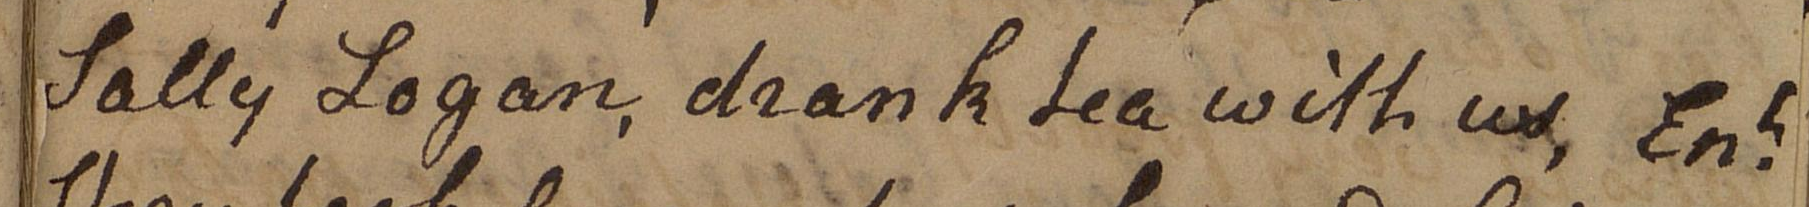Sally Logan, drank tea with us, En^h
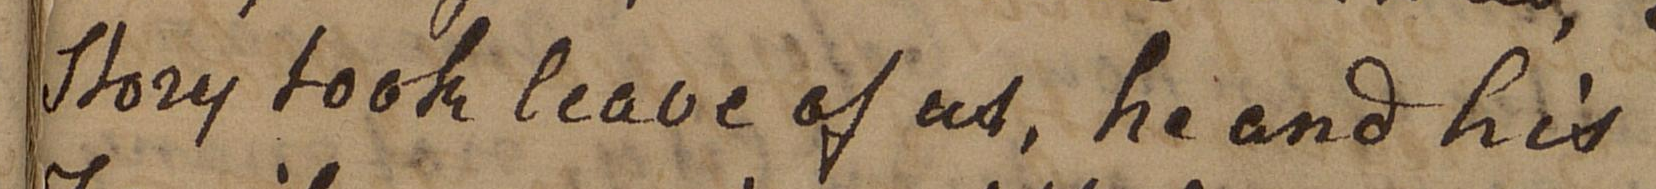Story took leave of us, he and his
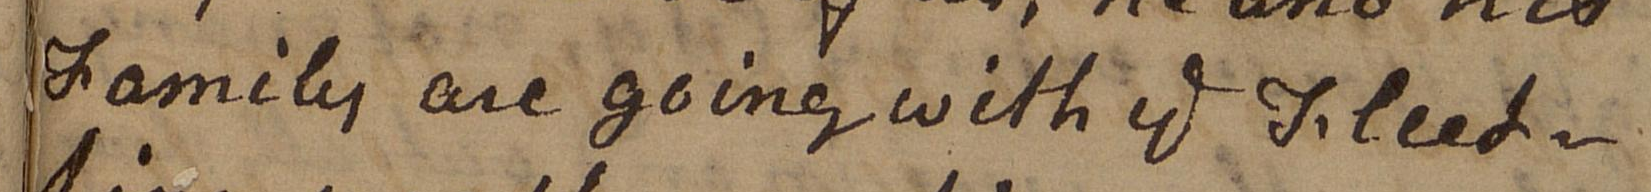Family are going with y^e Fleet-
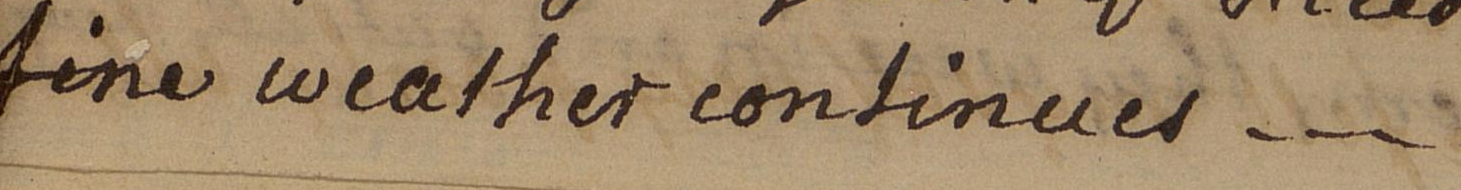fine weather continues--
